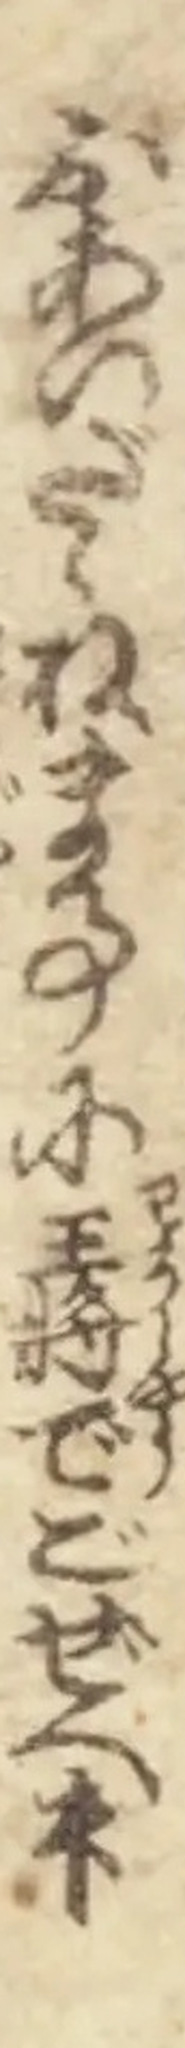おあいだゝねま事に王将でごぜへ升
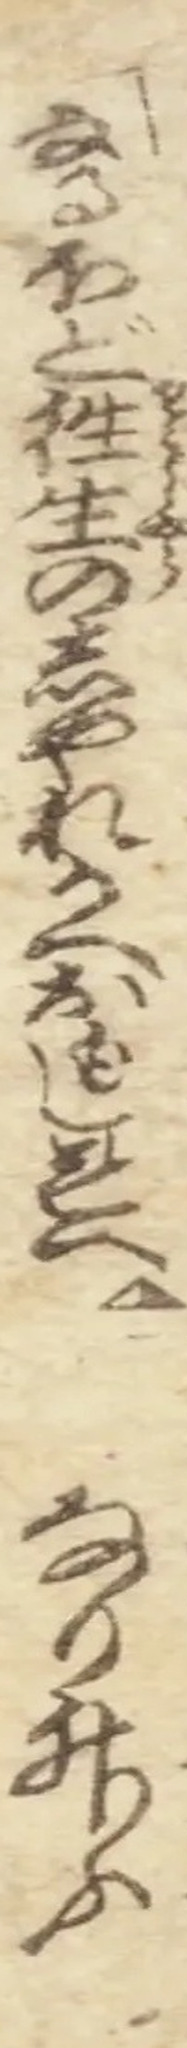「なるほど往生のしやれかへおもしれへ▲
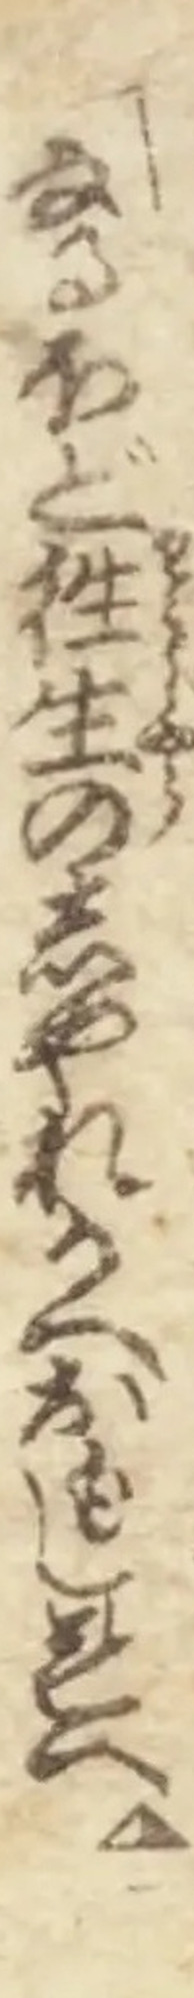「なるほど往生のしやれかへおもしれへ▲
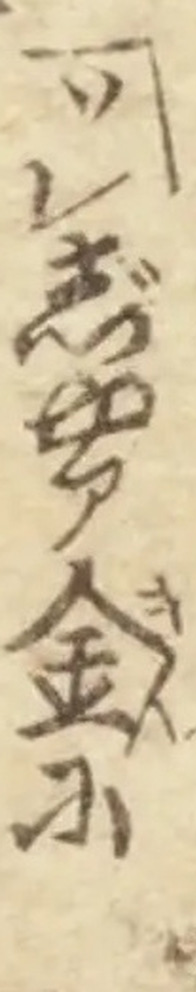「ソレじやア金に
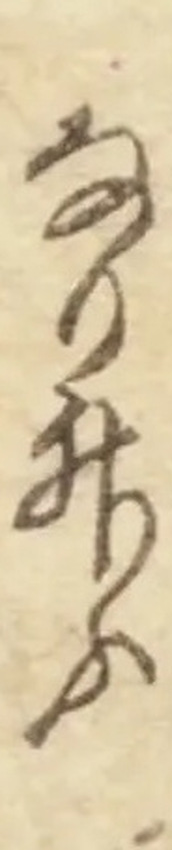なり升ふ
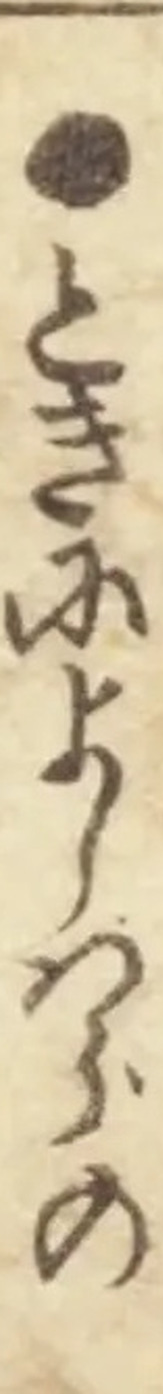●ときによしはらの
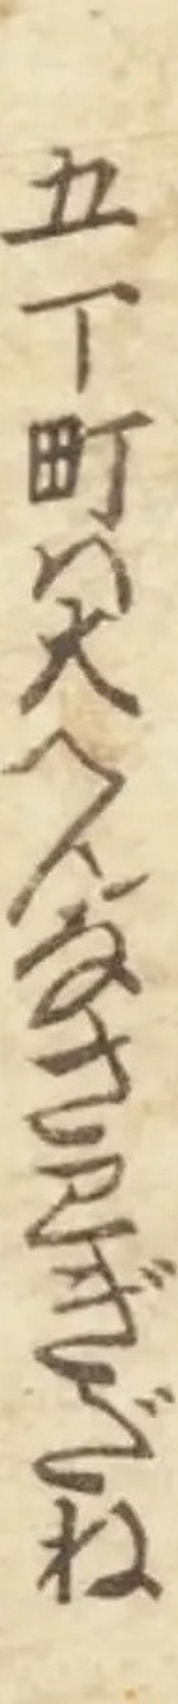五丁町は大へんなさわぎだね
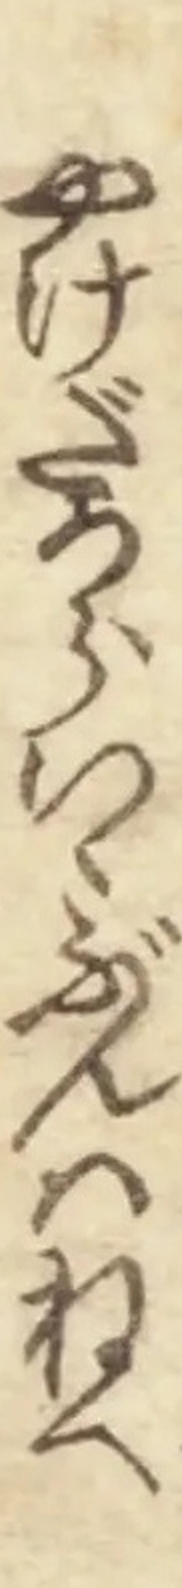やけだからいゝぶんはねへ
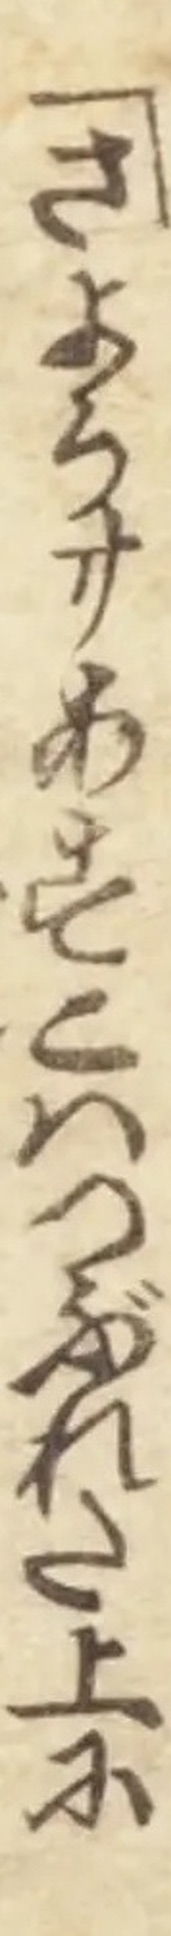「さようサあすこはつぶれた上に
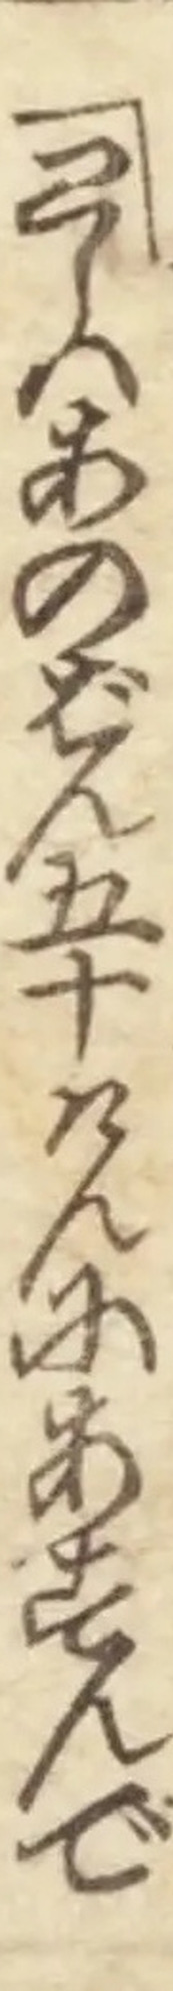「わしはあのばん五十けんにあすんで
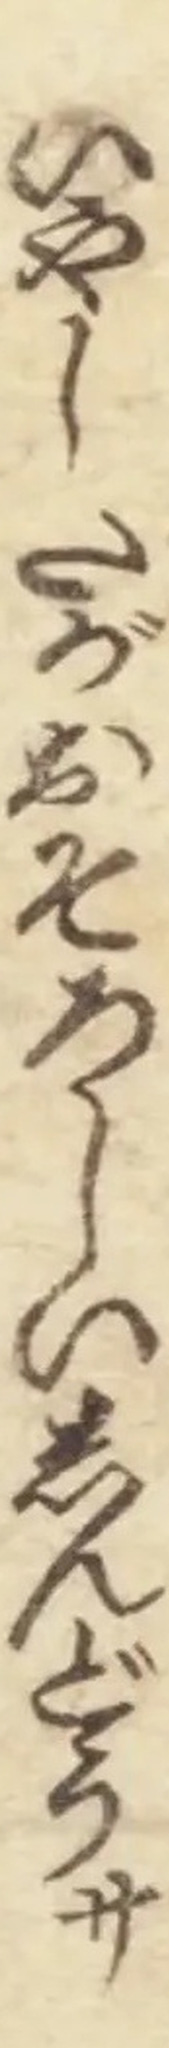いやしたがおそろしいしんどうサ
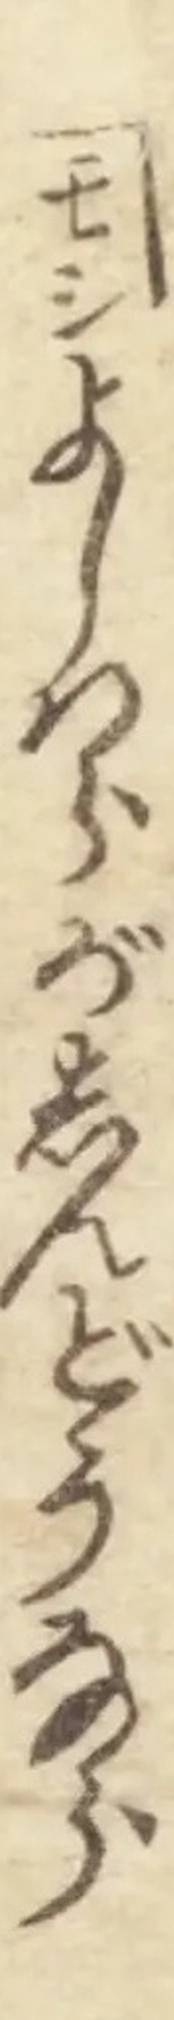「モシよしはらがしんどうなら
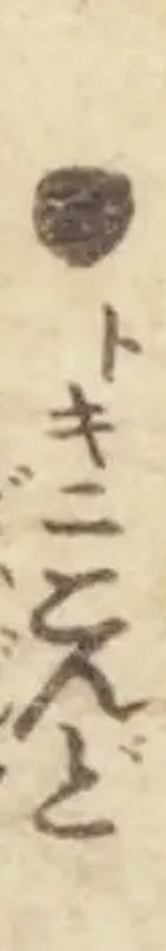●トキニこんど
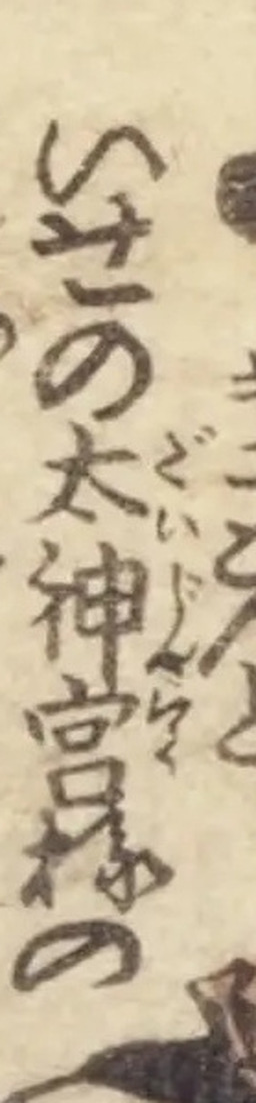いせの太神宮様の
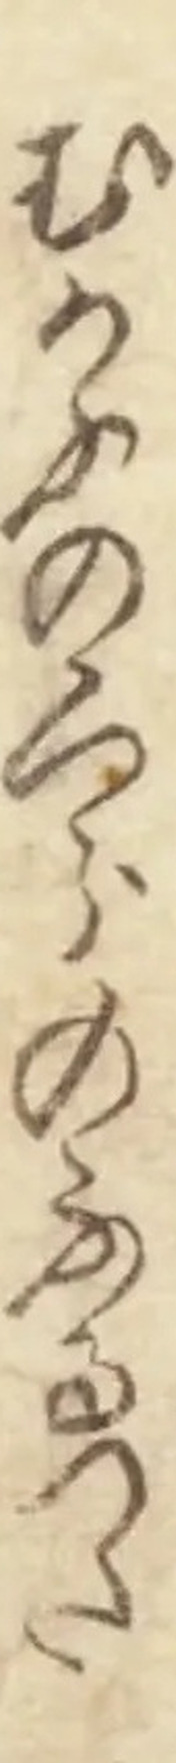むかふのくらのふるつた
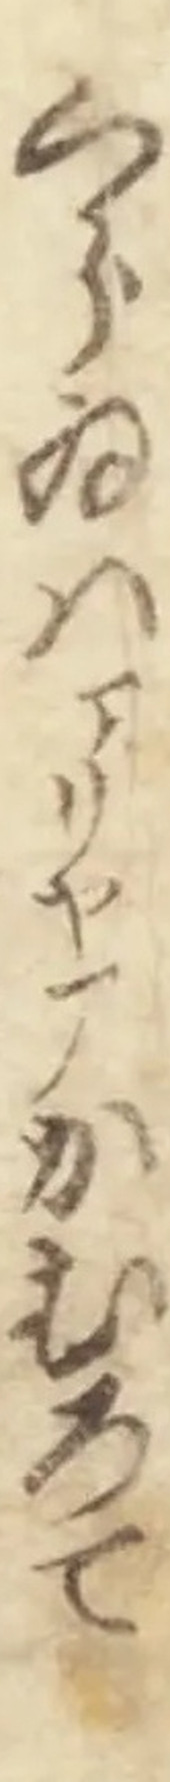くらゐはアリヤアかむろて
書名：二日はなし地震亭念魚町々庵炎上
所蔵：国立国会図書館 National Diet Library, JAPAN
